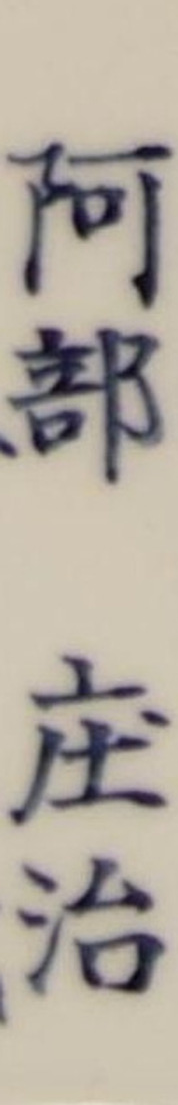阿部庄治
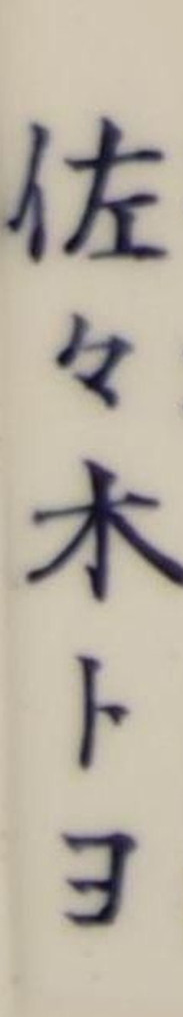佐々木トヨ

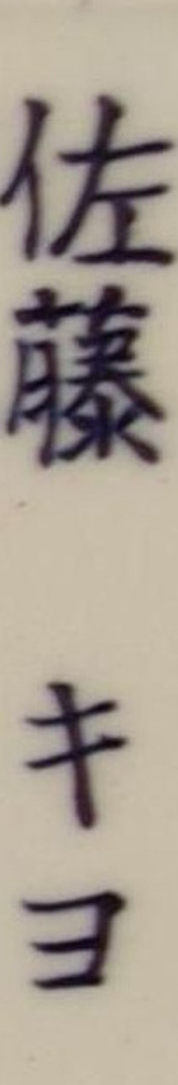佐藤キヨ
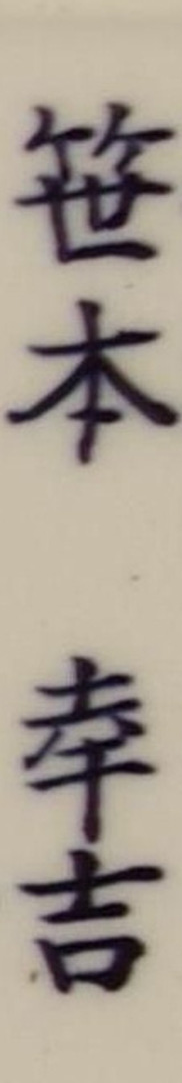笹本幸吉
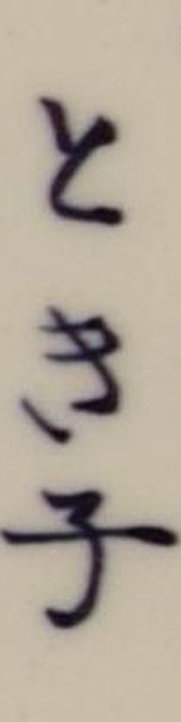とき子
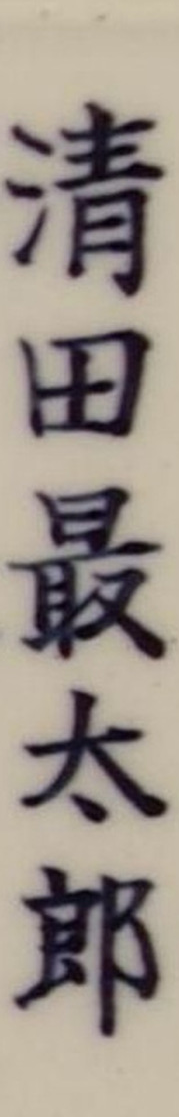清田最太郎
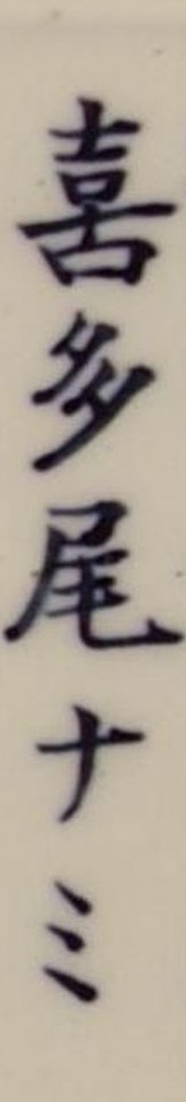喜多尾ナミ
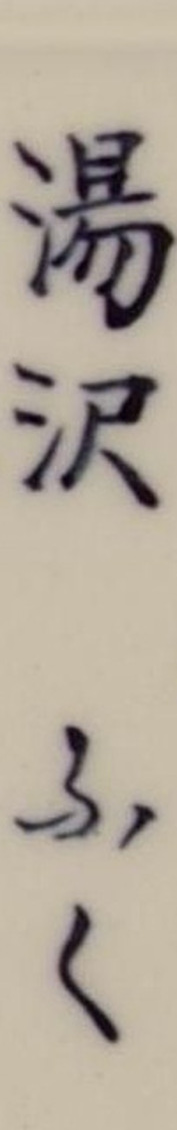湯沢ふく
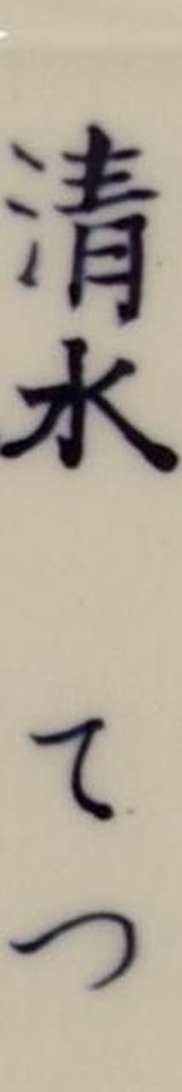清水てつ
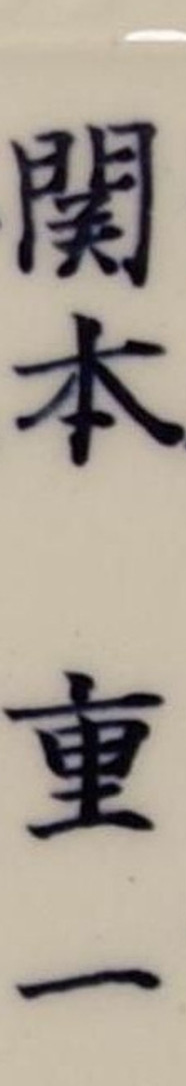関本重一
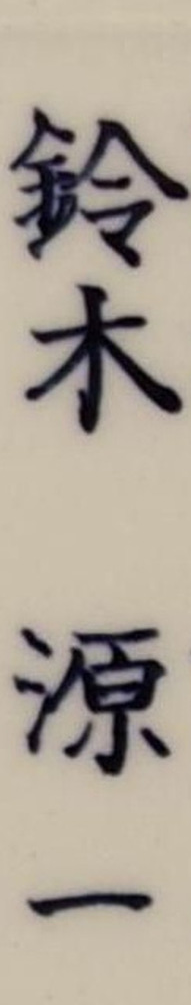鈴木源一
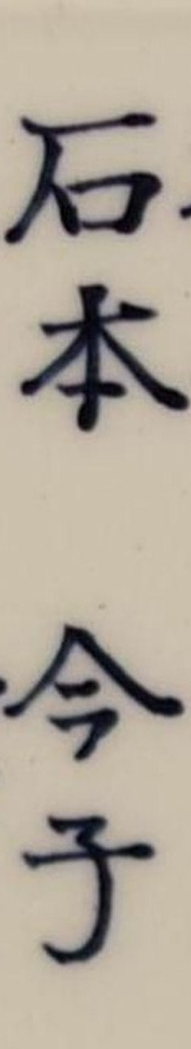石本今子
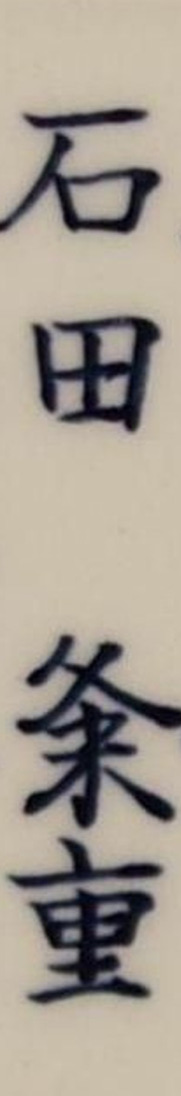石田粂重
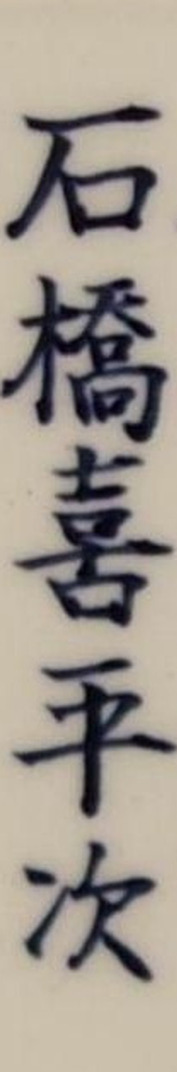石橋喜平次
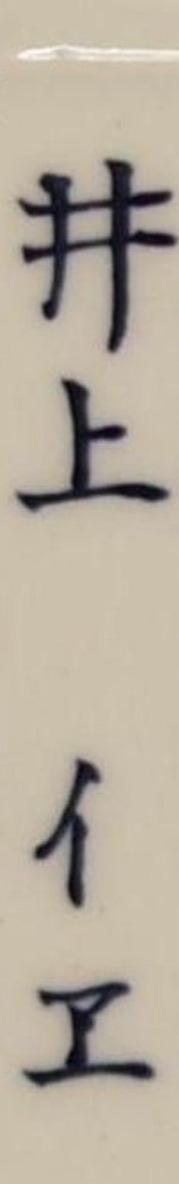井上イエ
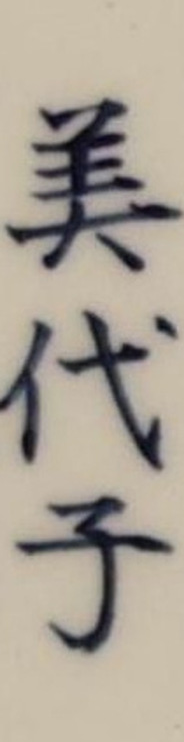美代子
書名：M~S
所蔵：高野山金剛峯寺
